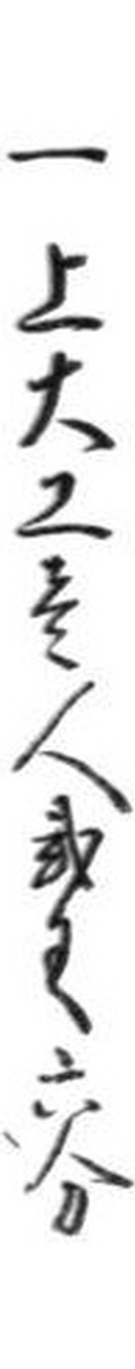一中大工壱人弐匁弐分同
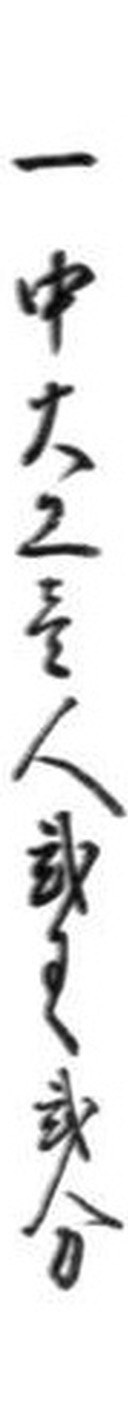一中大工壱人弐匁弐分同
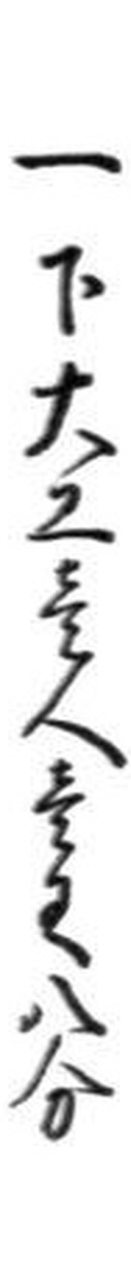一下大工壱人壱匁八分同
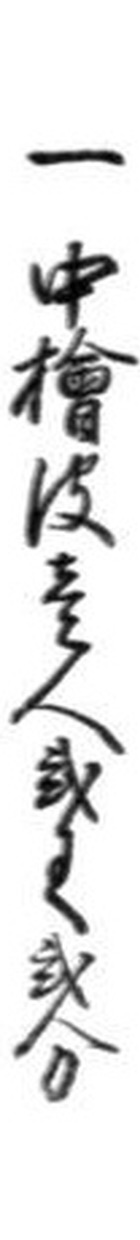一中桧皮壱人弐匁弐分同
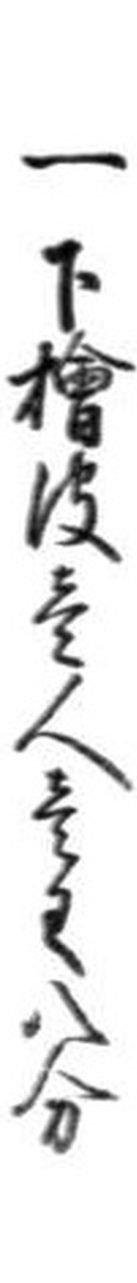一下桧皮壱人壱匁八分同
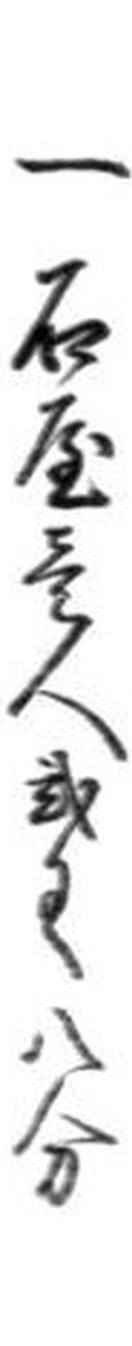一石屋壱人弐匁八分同
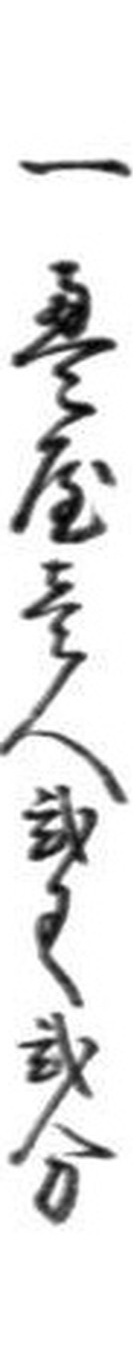一畳屋壱人弐匁弐分同
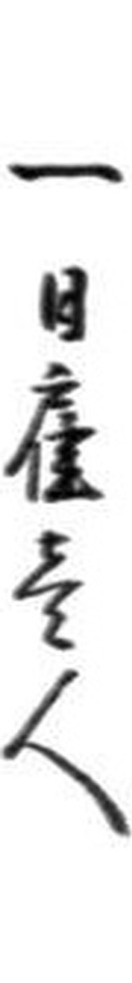一日雇壱人
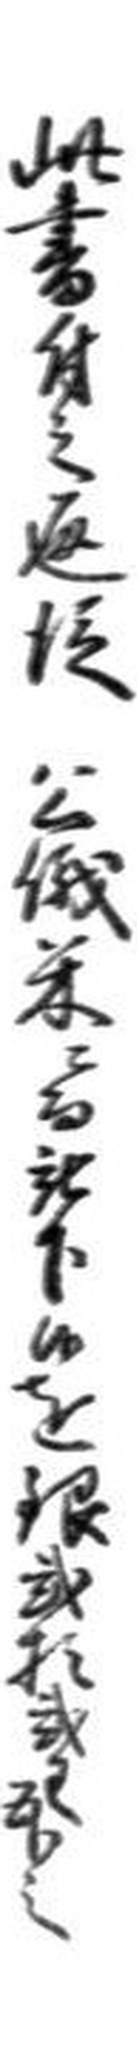此書付之通従公儀米ニ而被下候を銀弐拾弐匁五分之
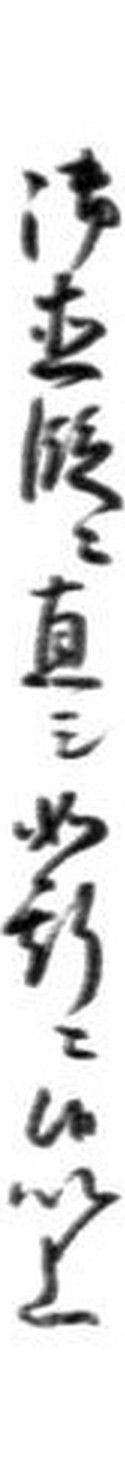御直段ニ直シ如斯ニ候以上

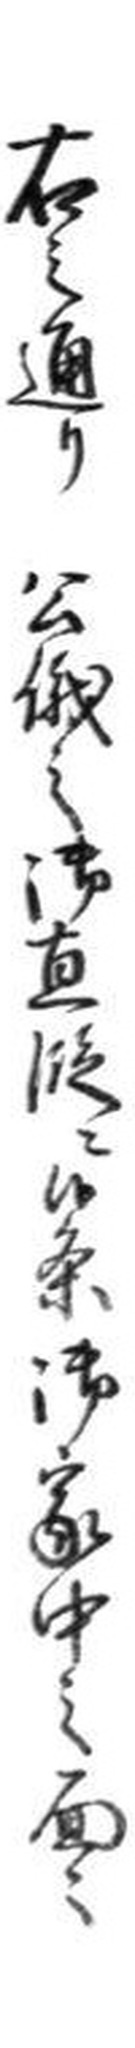右之通リ公儀之御直段ニ候条御家中之面々
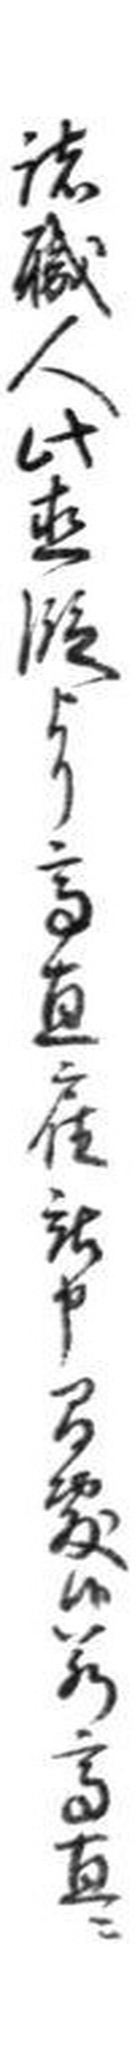諸職人此直段より高直雇被申間敷候若高直ニ
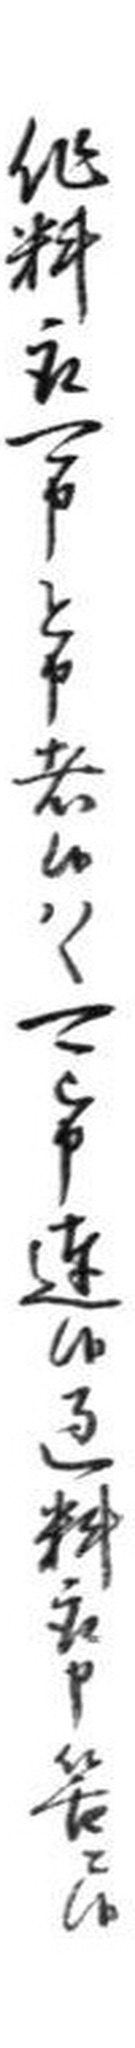作料取可申と申者候ハヽ可被申達候過料取申筈ニ候
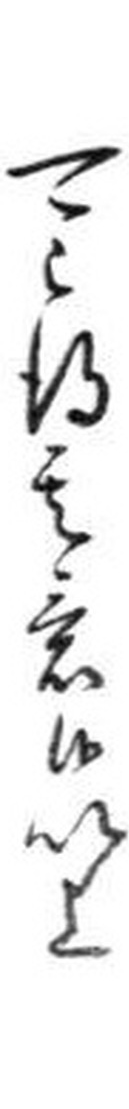可被得其意候以上
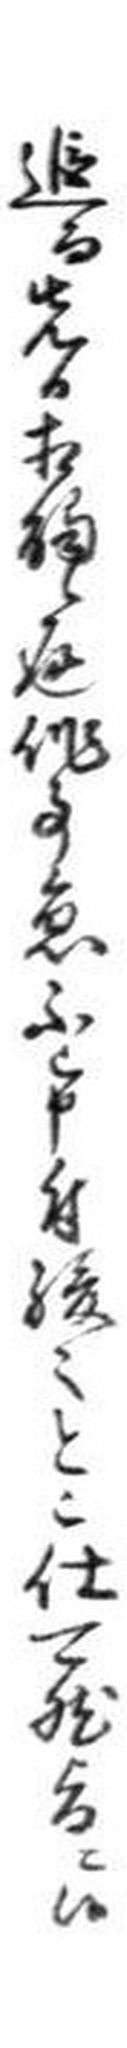追而先日相触候通作事急不被申付緩々と被仕可然旨ニ候
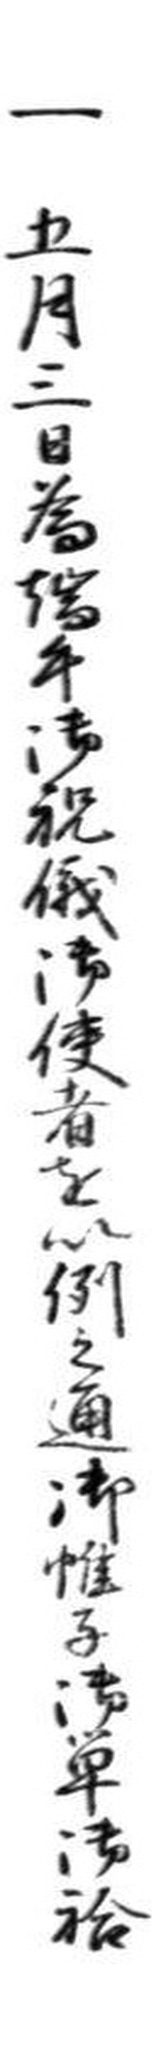一五月三日為端午御祝儀御使者を以例之通御帷子御単御袷
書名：家譜 七 光通公 従寛文四年到同九年
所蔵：福井県文書館 Fukui Prefectural Archives
